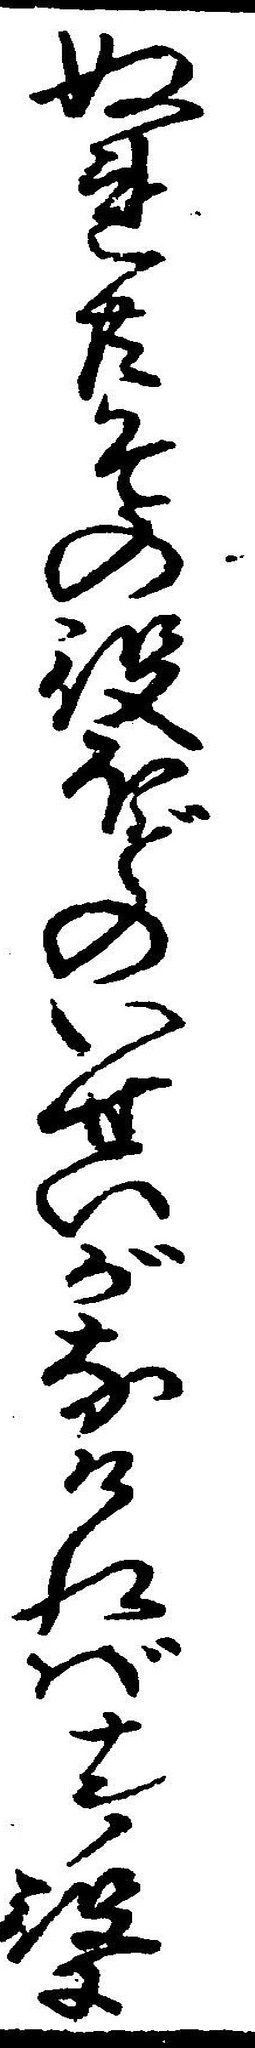ぬれ共その役ほどのいせいがなければナンノ役に
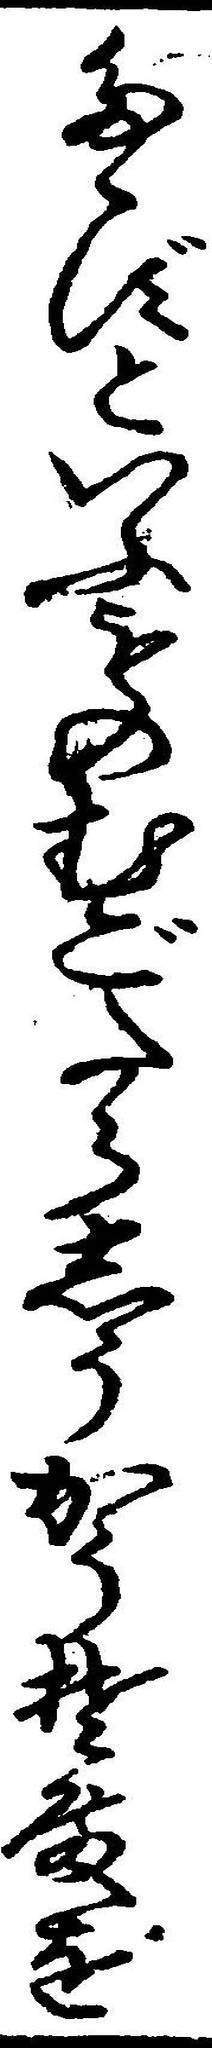たゝずといふものむごたらしうかうそ殿を
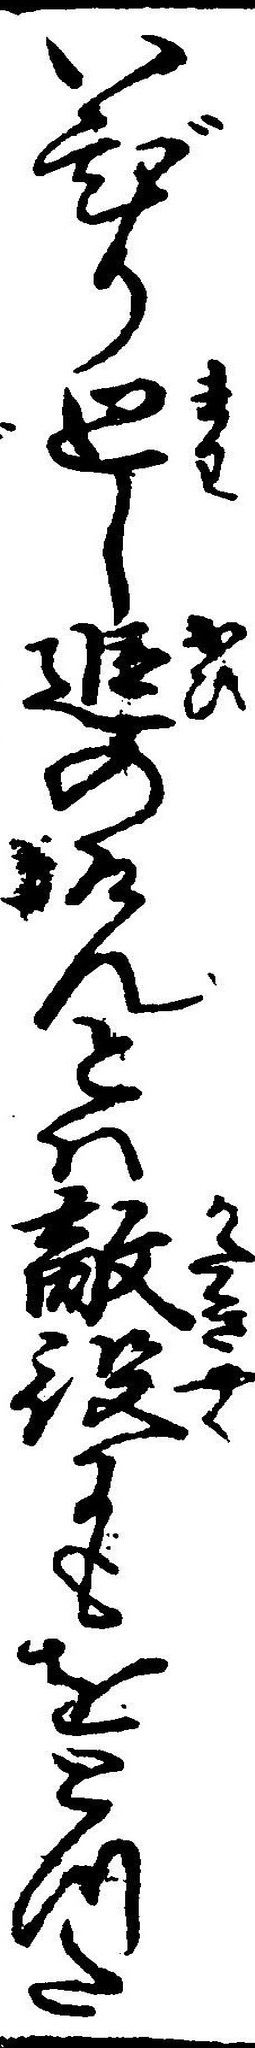いびり廻し追のけんとは敵役にもをとつた
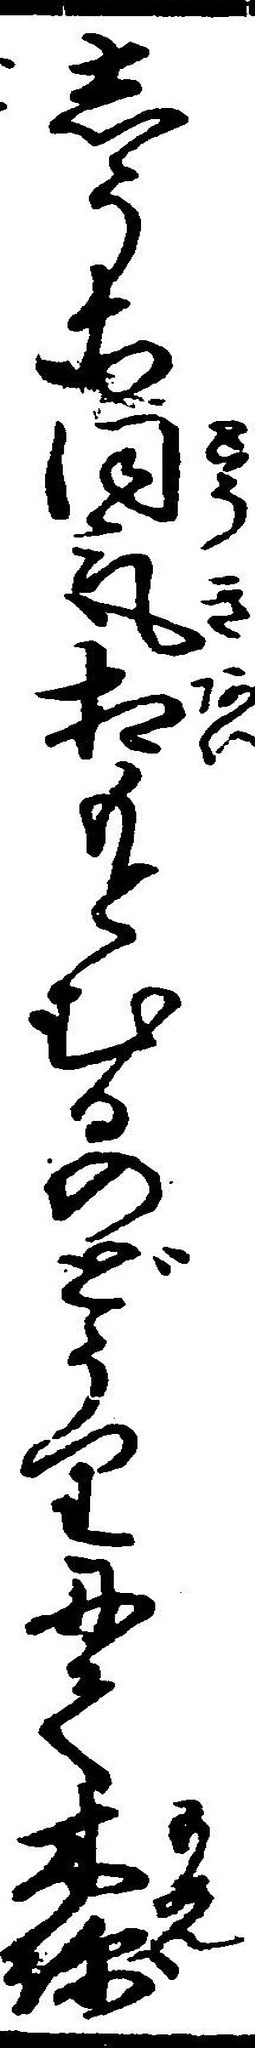しうち同気相もとむるのどうりにて木綿
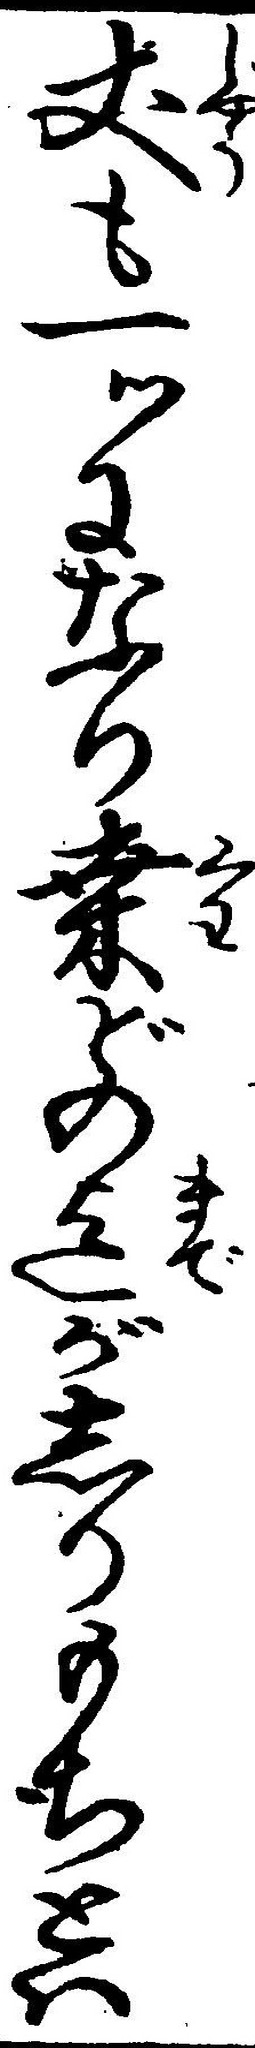丈も一ッになり桑どの迄がしりもちとは

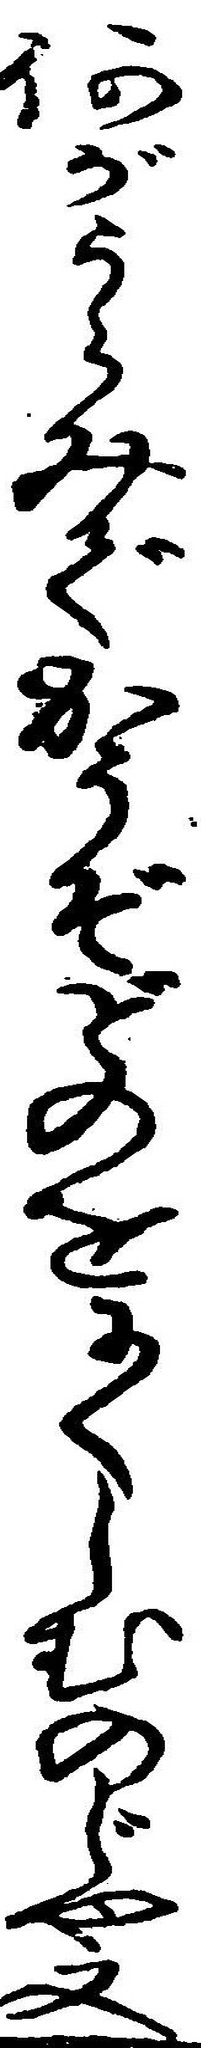何がうらみでかうぞどのをにくしむのじや又
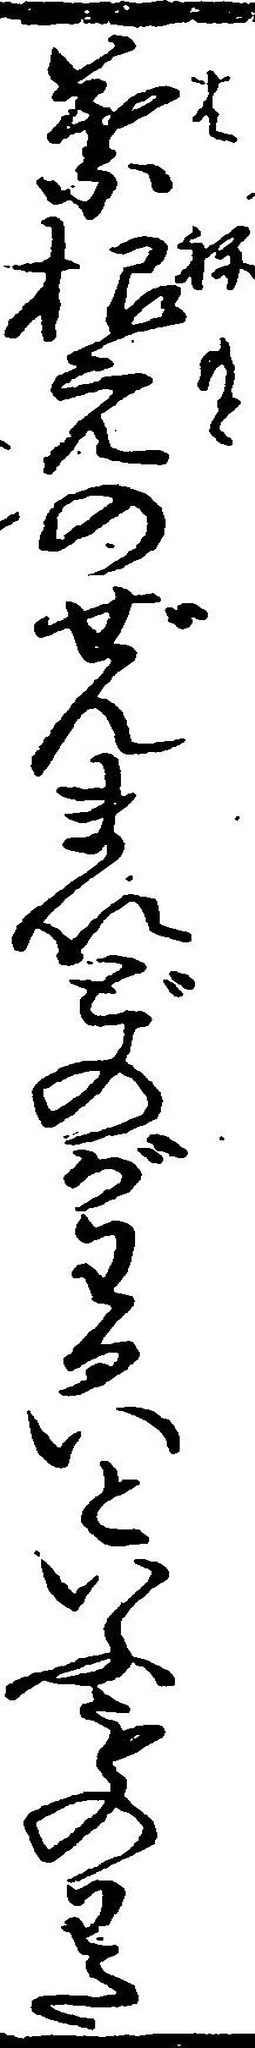葉根元のぜんまいどのがわるいといふものわた
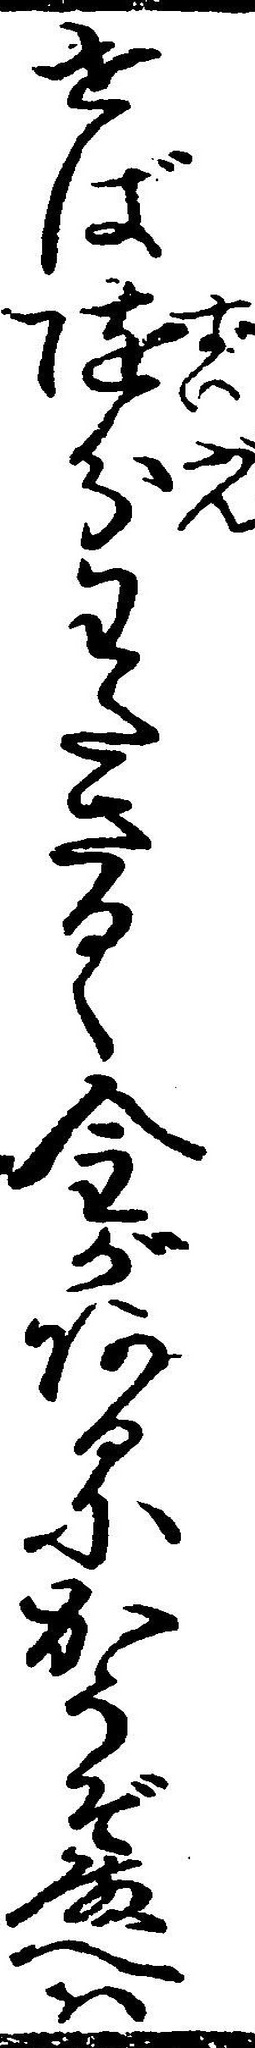せば随分わたさるゝ金があるにかうぞ殿へは
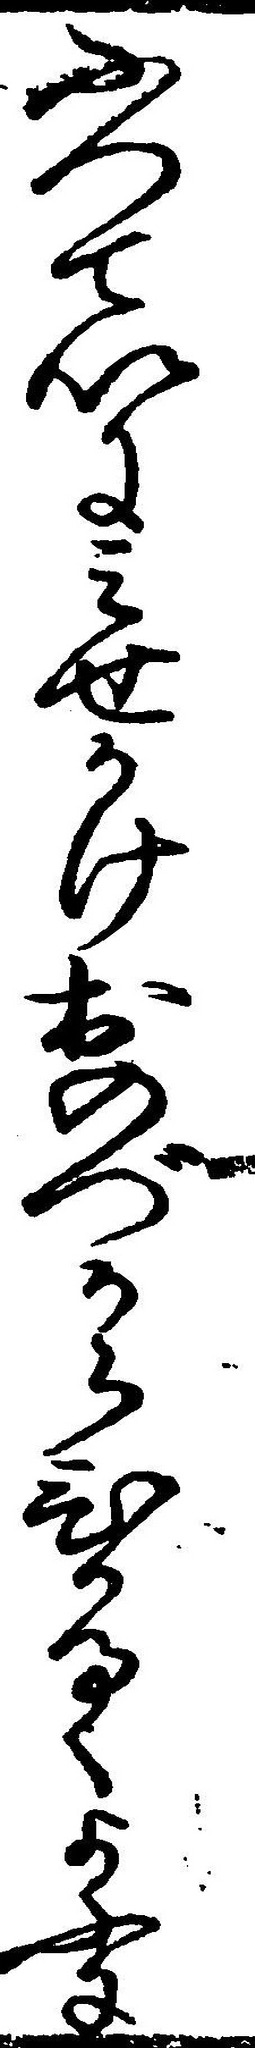ふつていにみせかけおのづからひかるゝよふに
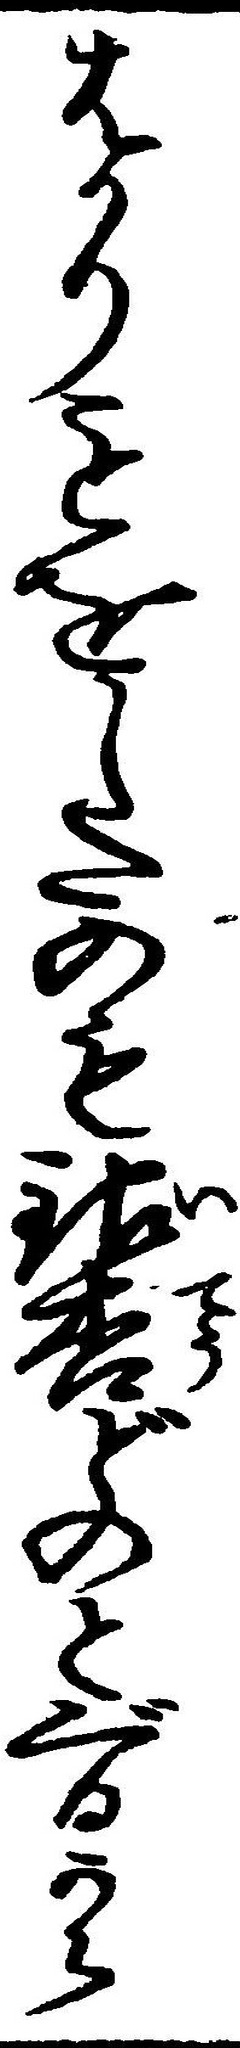はかりことをしたのも銀杏どのとぐるから
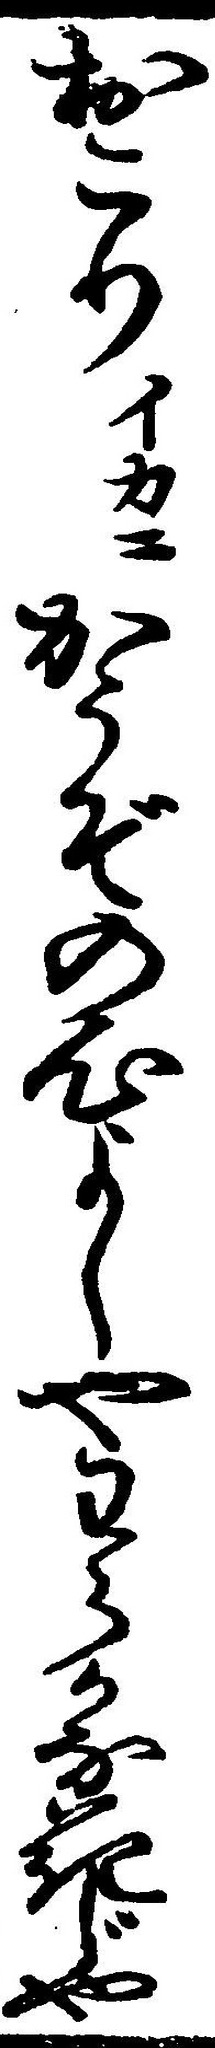おこりイカニかうぞの心よしやわらかな花じや
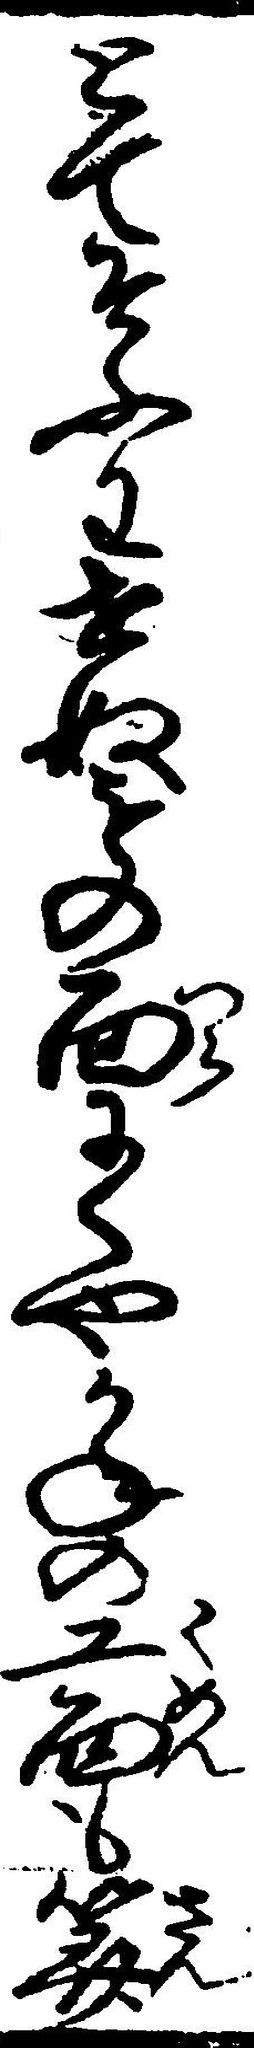とてそふわせぬもの面にくやかねの工面も算
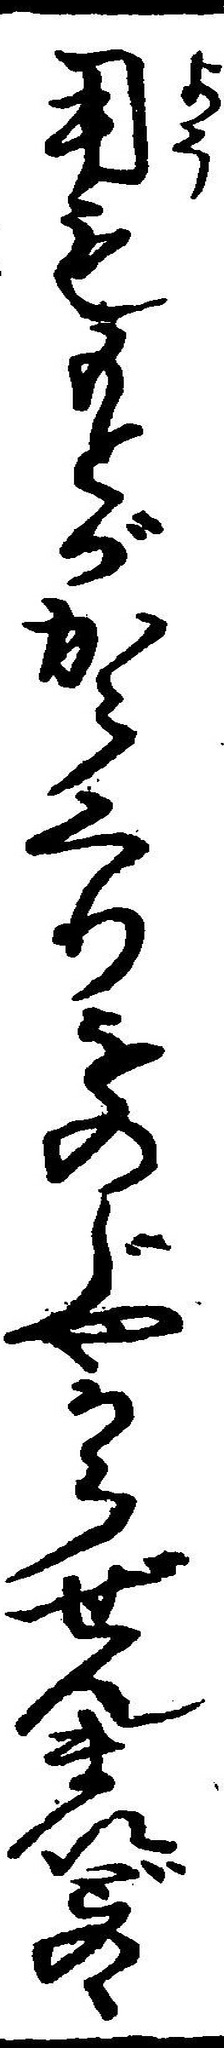用ももとがからくりものじやからぜないどのゝ
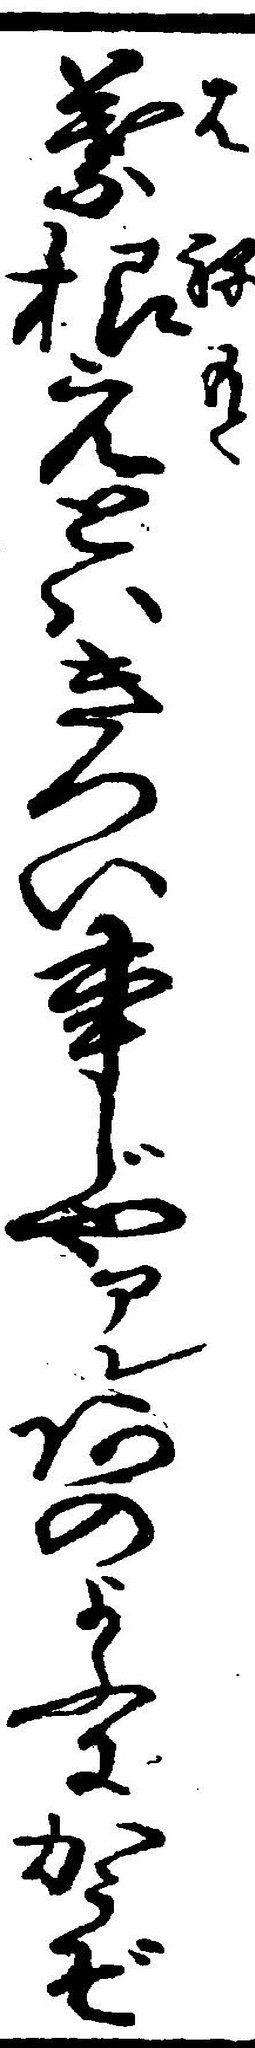葉根元とはきつい事じやアレあのよふにかうぞ
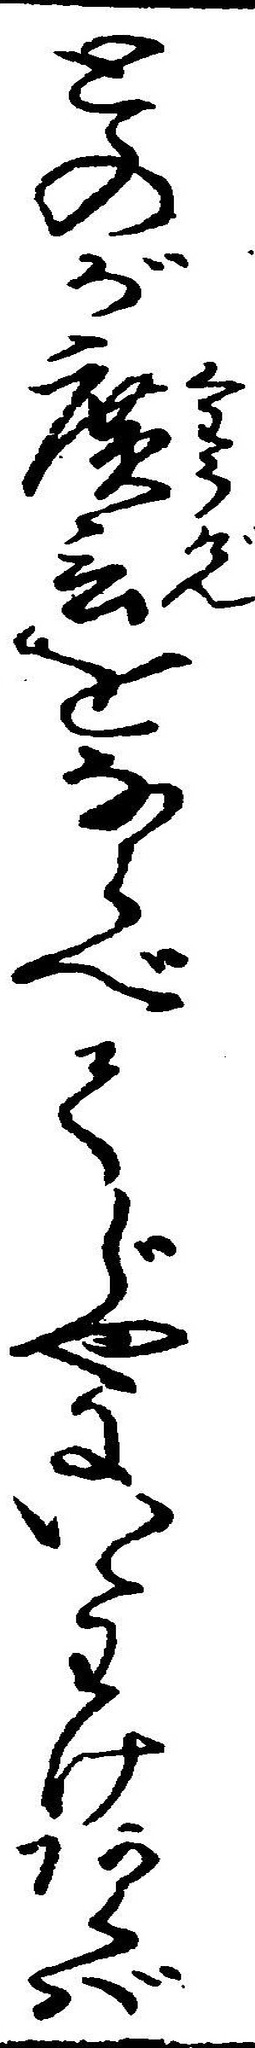とのが広言をならべてじやにいゝわけあらば
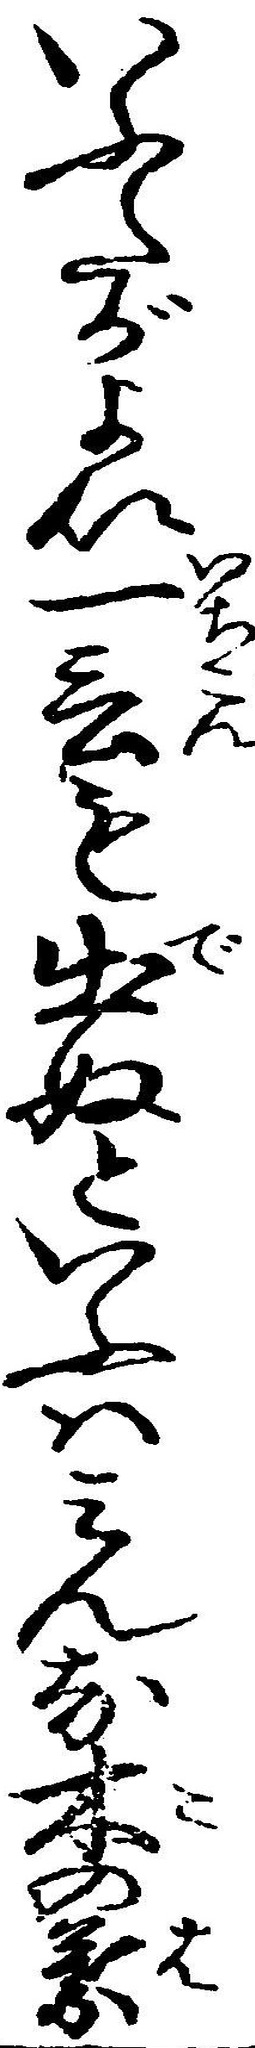いふたがよい一言も出ぬといふはみんな木の葉
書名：草木芝居化物退治 / 泉花堂三蝶(十六兵衛)作
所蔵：東京大学総合図書館 General Library in the University of Tokyo, JAPAN
